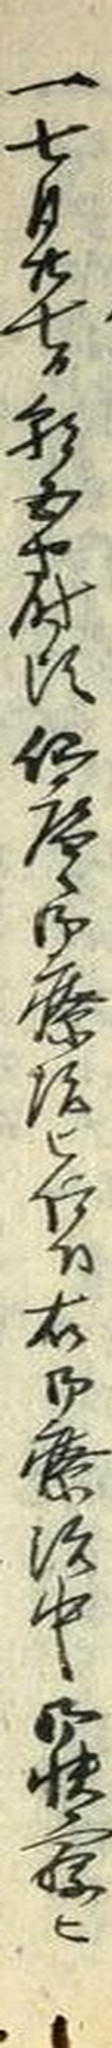一七月廿七日朝五半時頃仙庵へ御療治被仰付右御療治中御快寝被
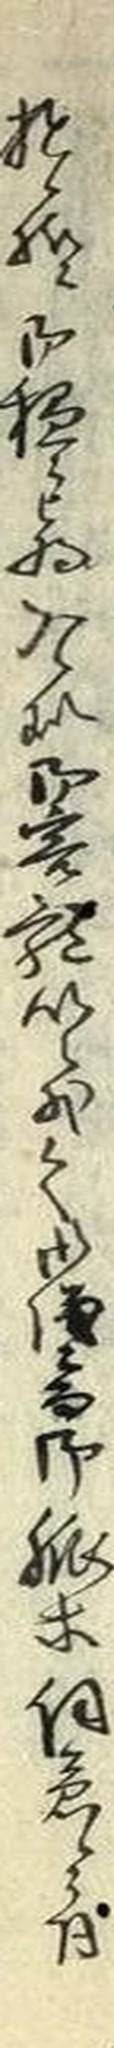遊候様ニ御穏ニ被為入候処御容軆以之外之御儀ニ而御脈等伺兼候ニ付
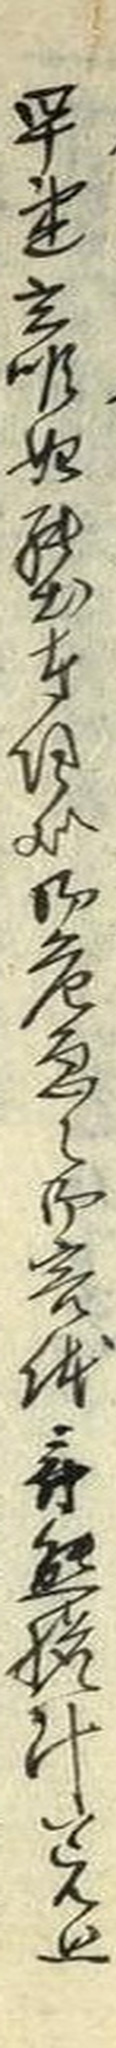早速玄順始罷出奉伺候処御危急之御容体ニ付熊胆膽汁差上
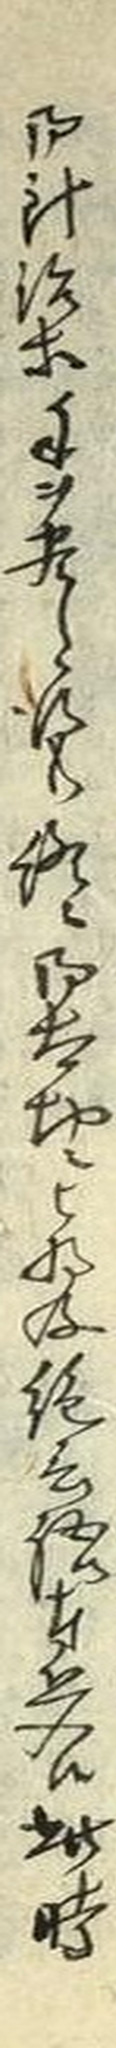御針治等手ヲ尽候得共終ニ御大切ニ被為及絶言語奉恐入候此時
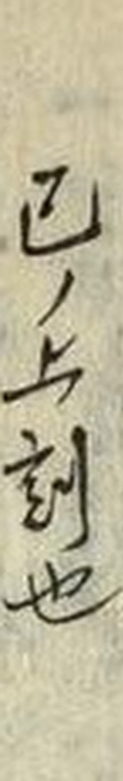巳ノ上刻也
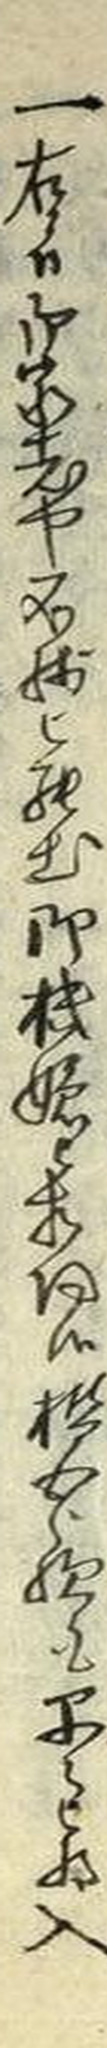一右ニ付御家老中不残被罷出御機嫌被相伺候楷五郎様も早々被為入
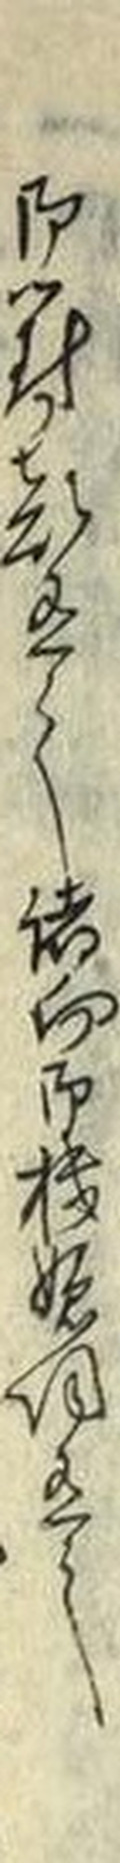御対顔有之諸向御機嫌伺有之
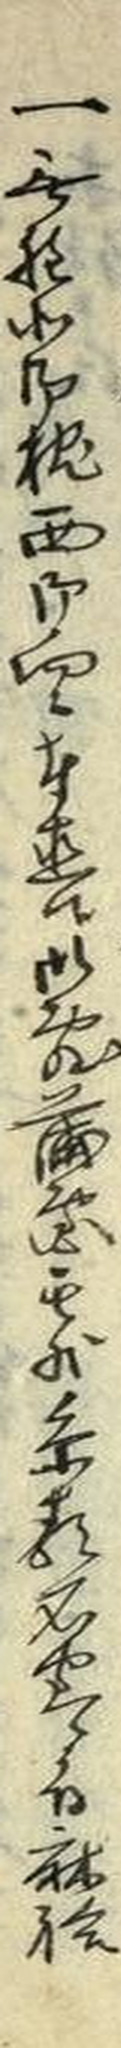一無程北御枕西御向ニ奉直候御敷蒲団其外糸類不宜候ニ付麻袷
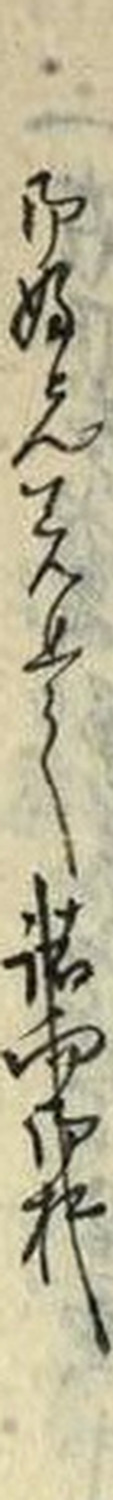御ふとん差上之諸向御礼

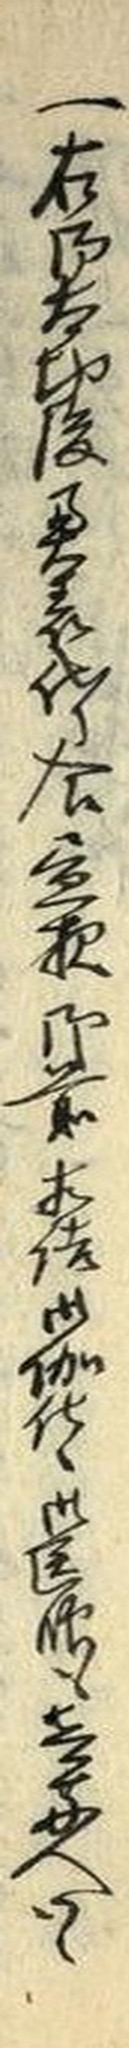一右御太切後奥表代り合昼夜御前相詰御伽仕候御医師も壱両人ツヽ
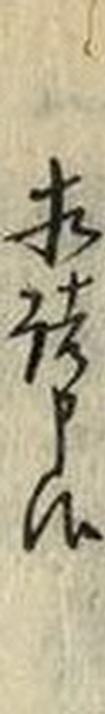相詰申候
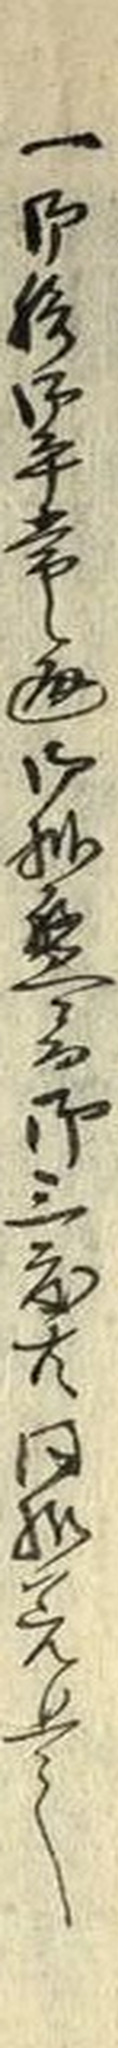一御膳御平常之通御掛盤ニ而御三度共同様差上之
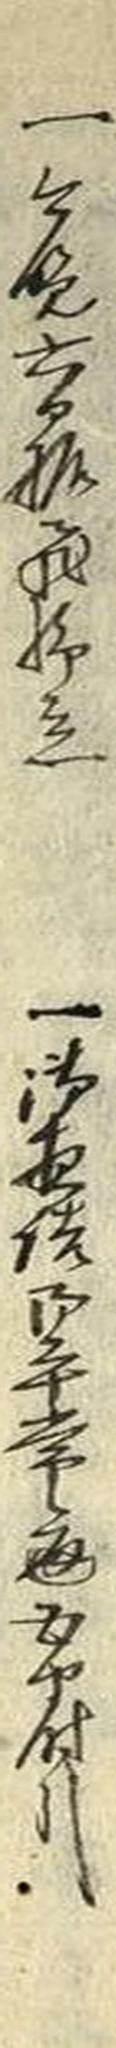一今晩六日振飛脚立一御夜詰御平常之通五半時引
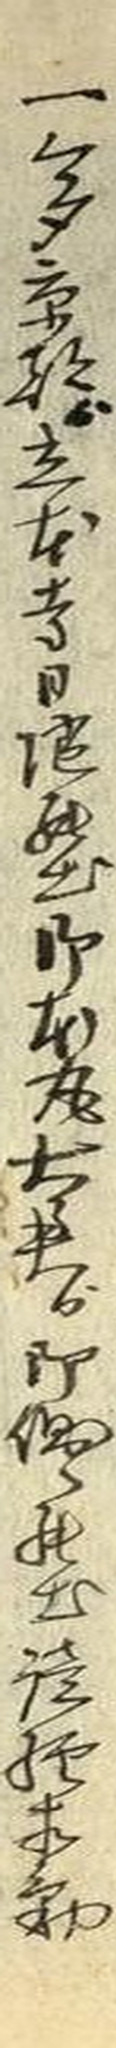一今夕京都ゟ立本寺日随罷出御本丸大奥ゟ御側へ罷出読経相勤
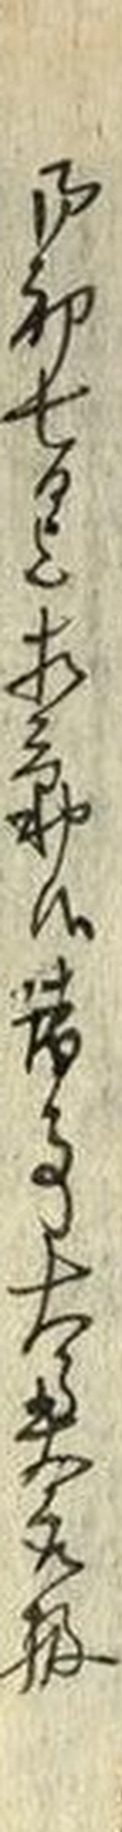御初七日迄相勤候諸事大奥取扱
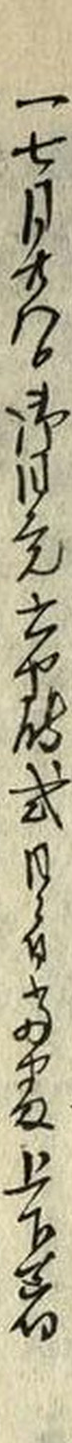一七月廿八日御目覚六半時式日ニ付当番上下着
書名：少傅日録抄（斉善付側向頭取日記、江戸并道中、初入在国、逝去後…
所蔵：福井県文書館 Fukui Prefectural Archives
